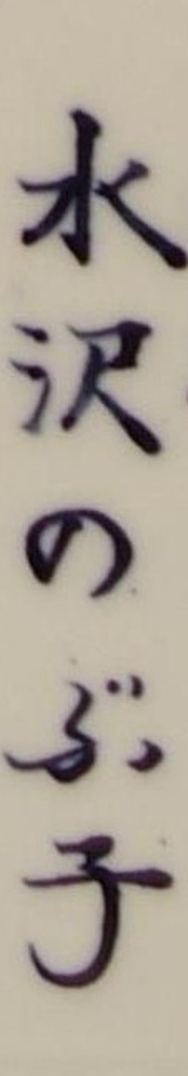水沢のぶ子
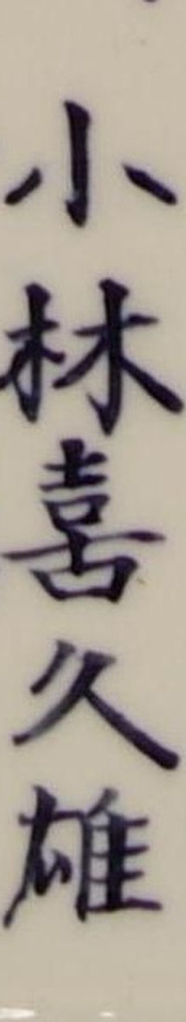小林喜久雄
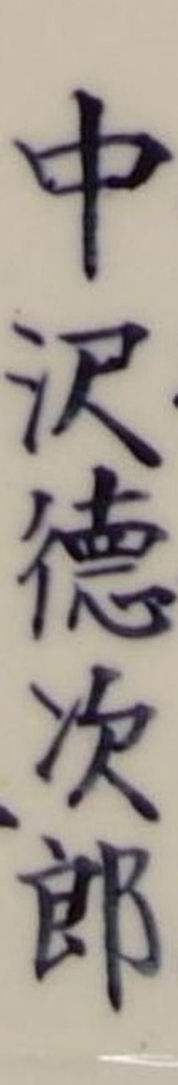中沢徳次郎
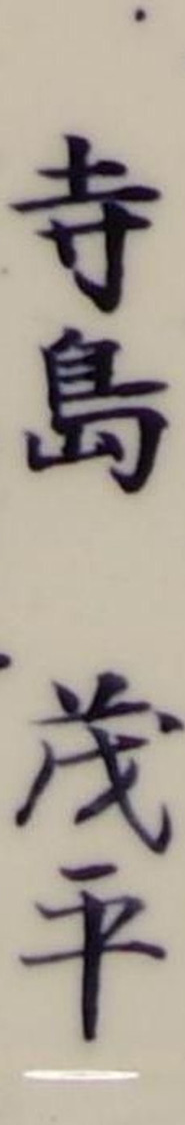寺島茂平
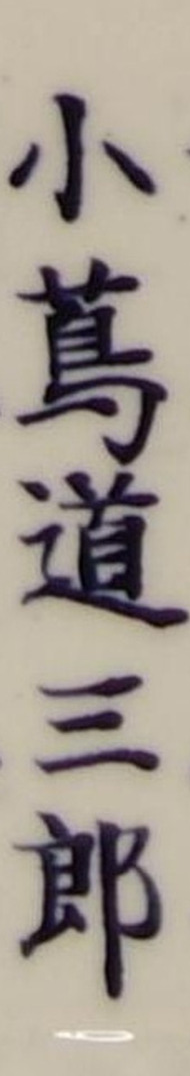小蔦道三郎
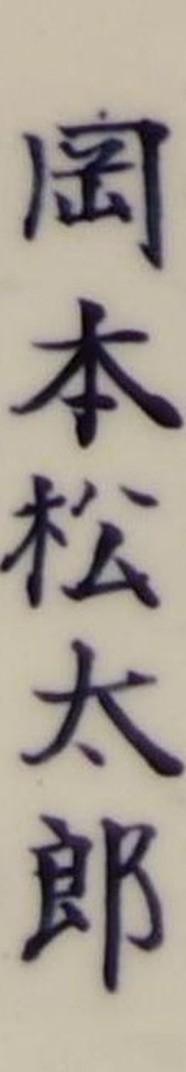岡本松太郎
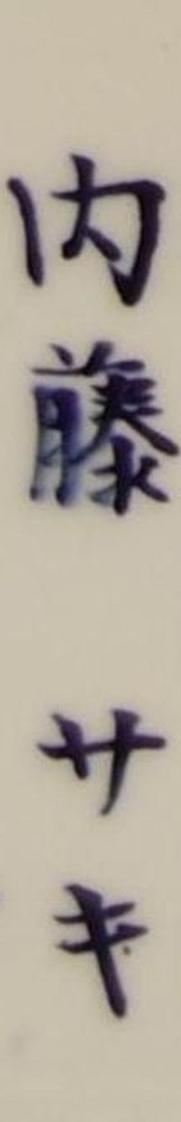内藤サキ
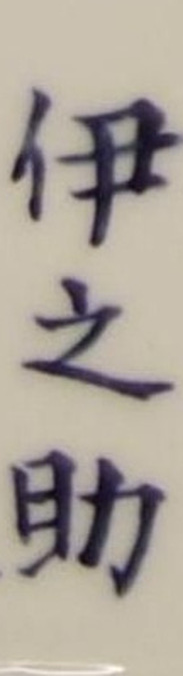伊之助
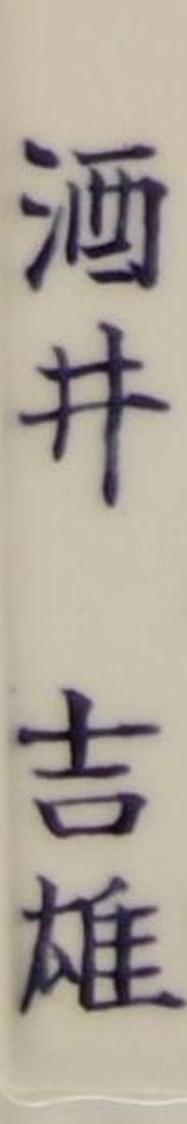酒井吉雄

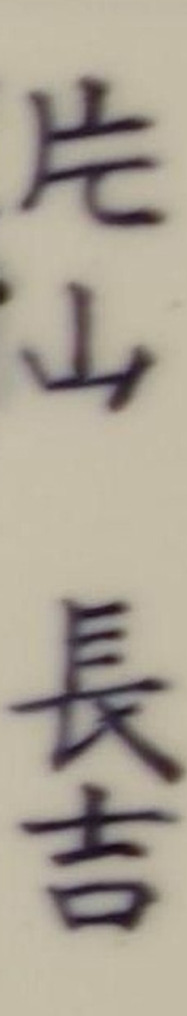片山長吉
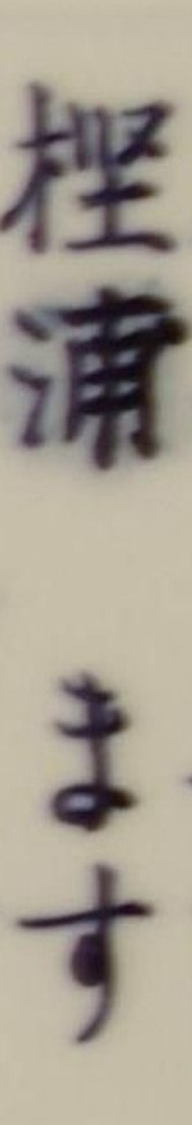樫浦ます
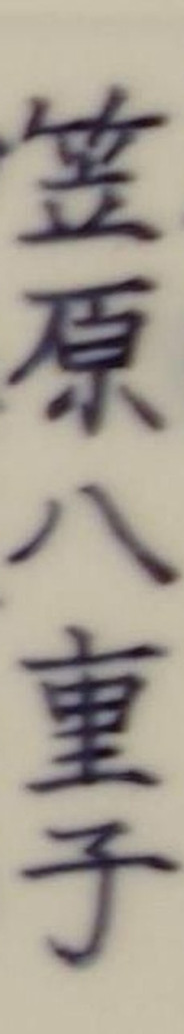笠原八重子
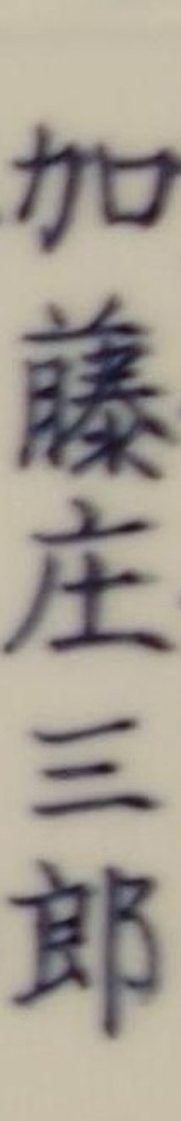加藤庄三郎
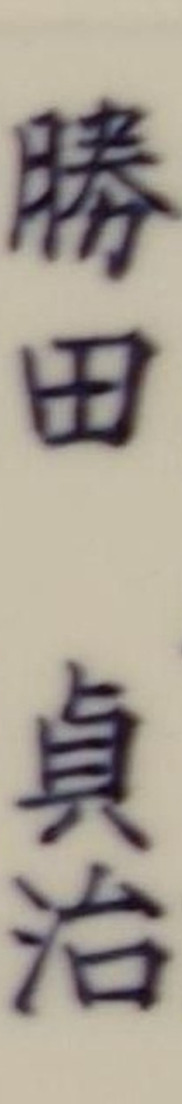勝田貞治
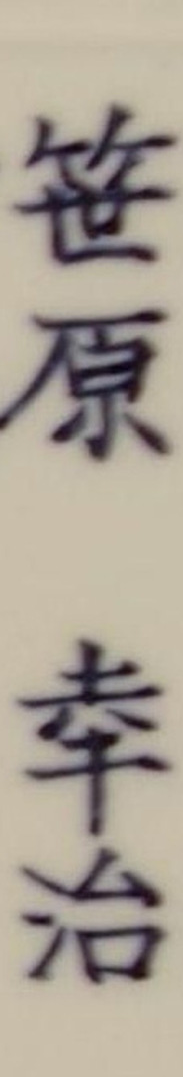笹原幸治
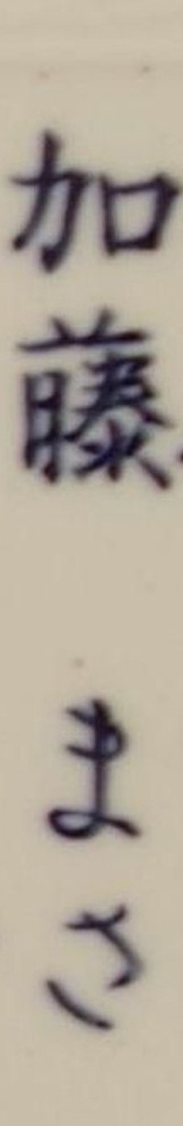加藤まさ
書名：E~L
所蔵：高野山金剛峯寺
